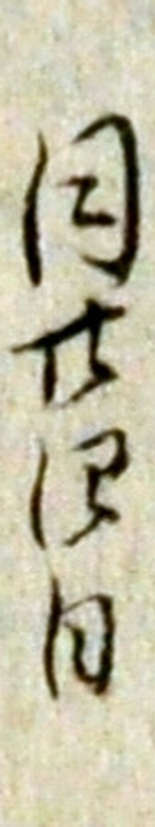同廿四日
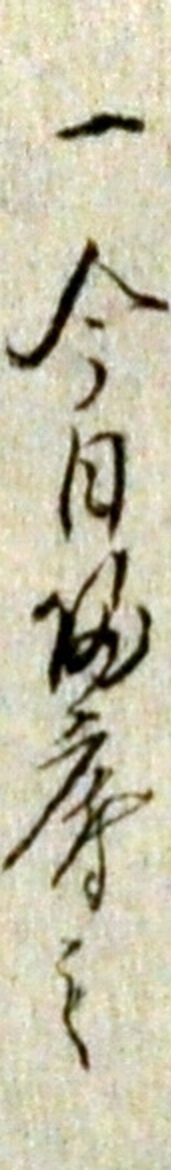一今日帰府之
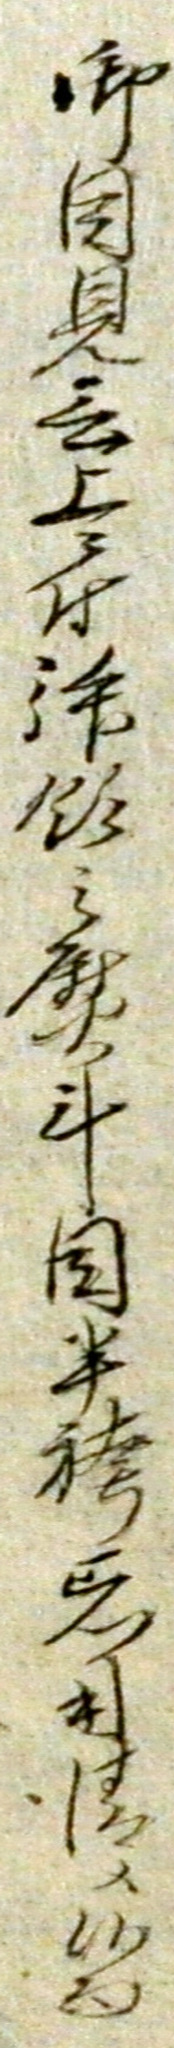御目見言上ニ付拝領之熨斗目半袴着用清メ候而
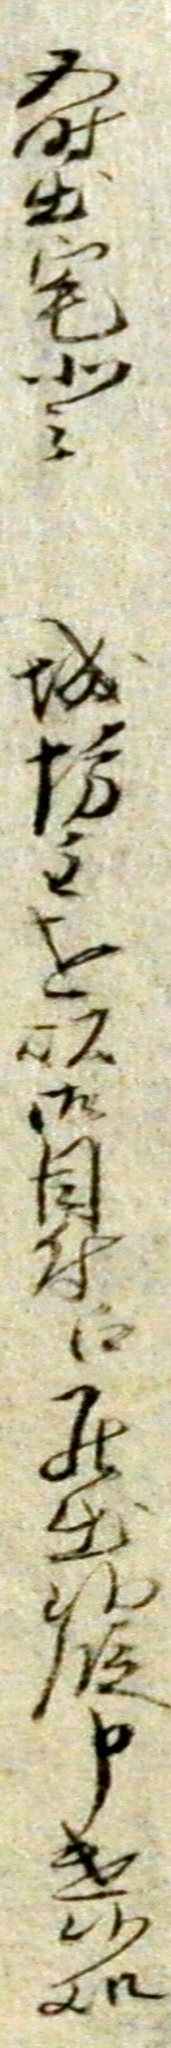五時出宅登城坊主を以御目付江罷出候段申遣候処
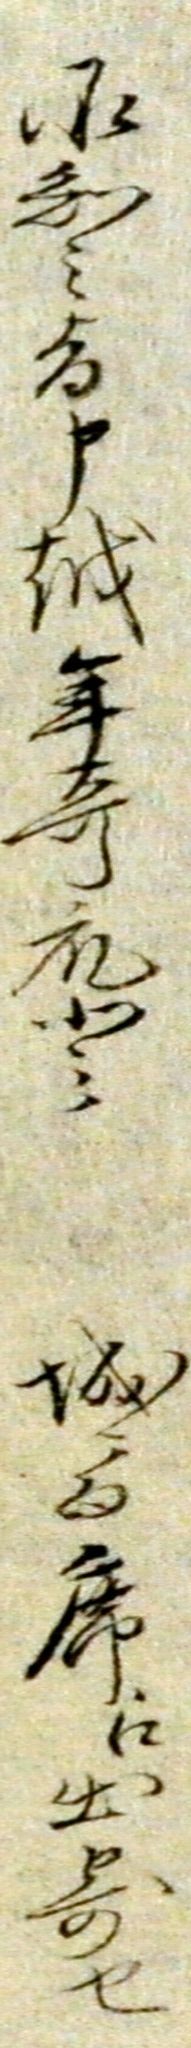承知之旨申越年寄衆登城二而席江出寄セ
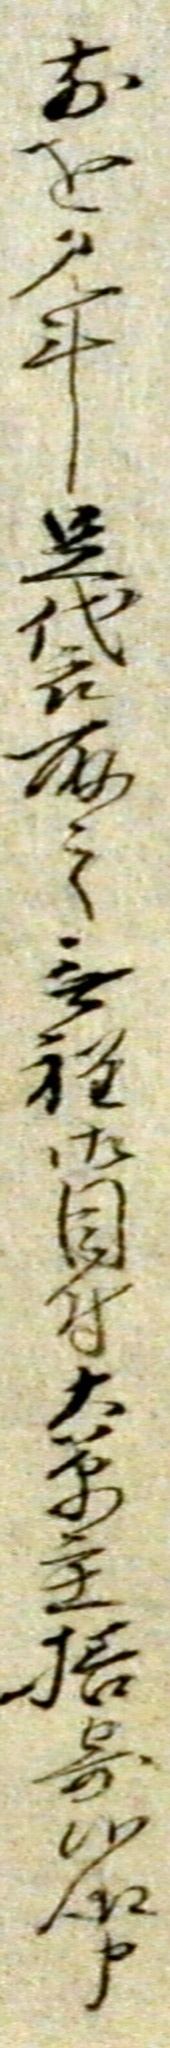前を見斗足袋取之無程御目付大草主膳寄候様申
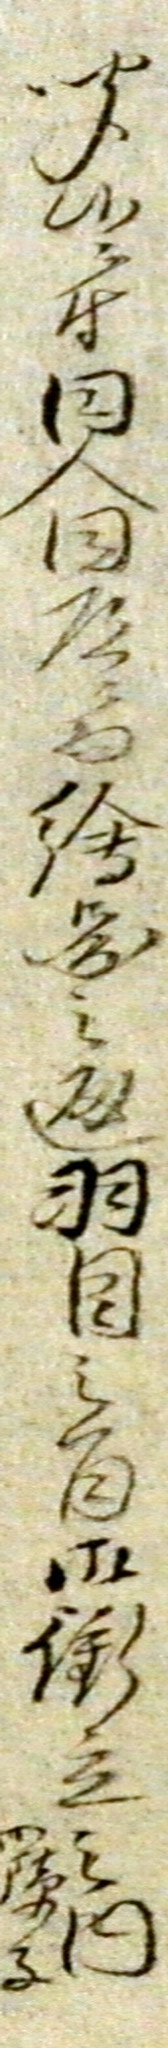聞候二付同人同道ニ而絵図之通羽目之御障子
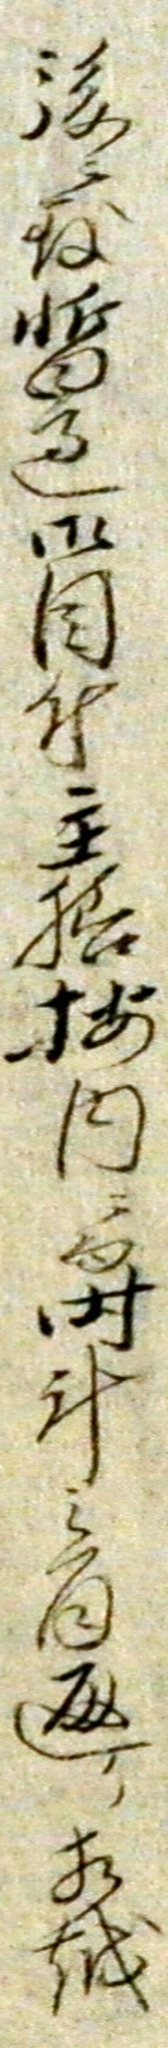後ニ致暫過御目付主膳按内ニ而時計の間通り相越
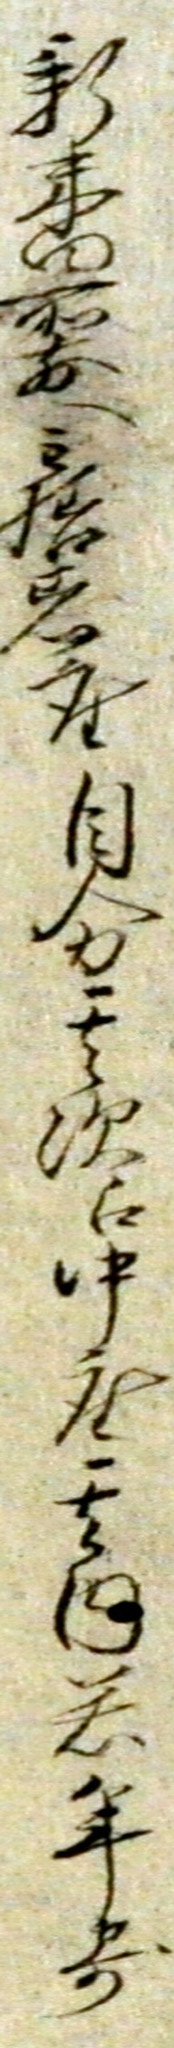新番所前へ主膳着座自分其次江中座其内若年寄
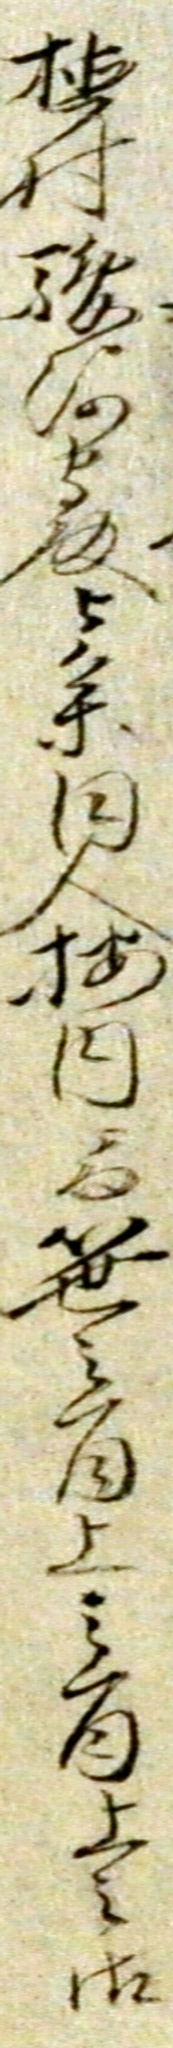植村駿河守殿ヒ参同人按内ニ而笹之間上之間上之御
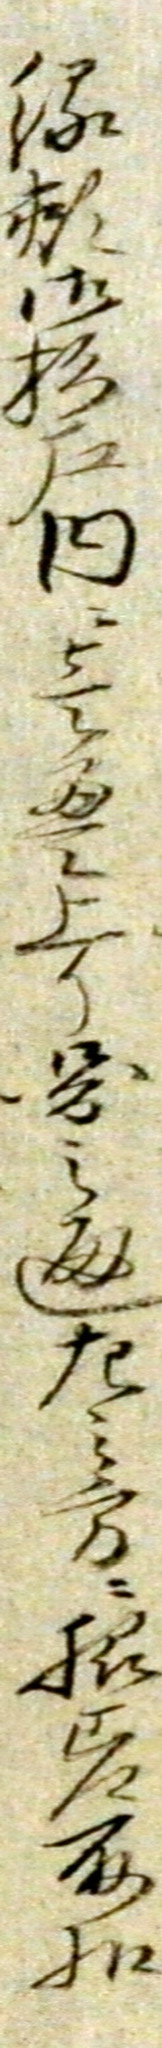縁頬御杉戸内二壱畳上り図之通左之方ニ脇差取扣
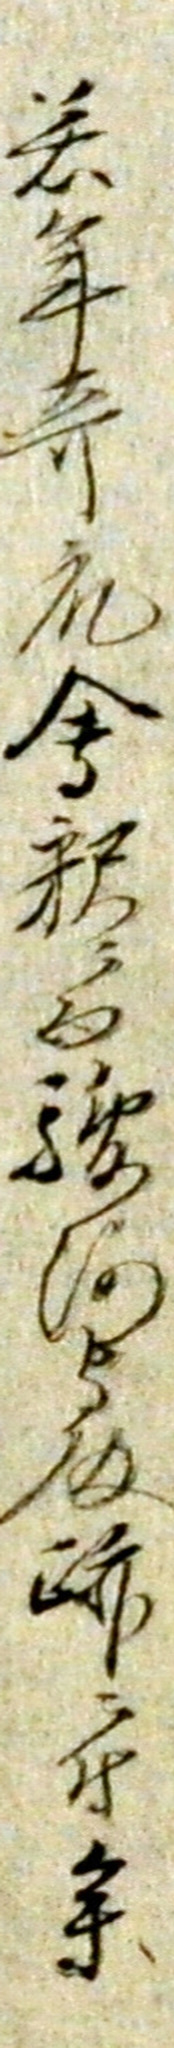若年衆会釈ニ而駿河守殿跡ニ付参
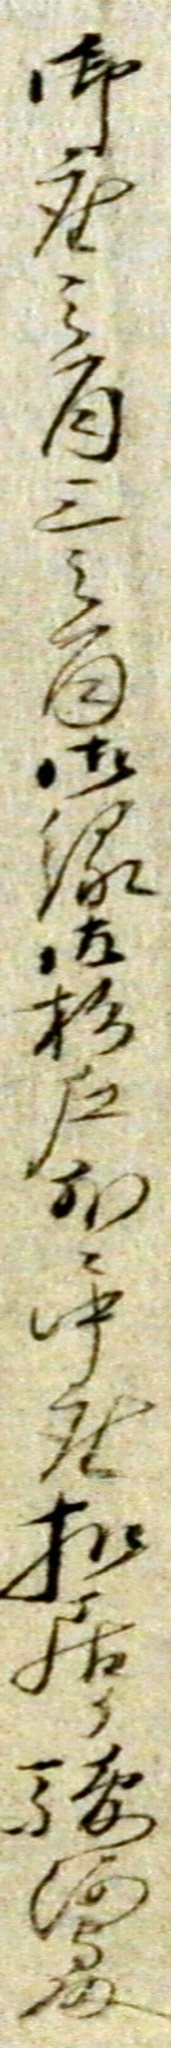御座之間三之間御杉戸外二中座扣居り駿河守殿
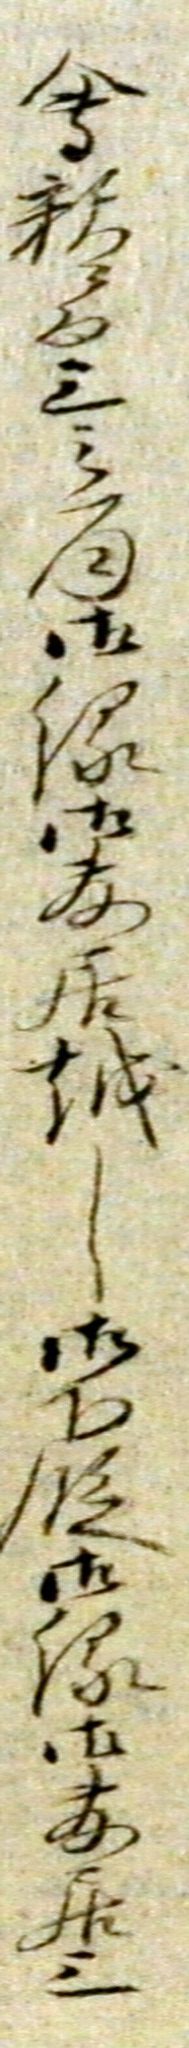会釈ニ而三之間御縁御敷居越し御下段御縁御敷居三
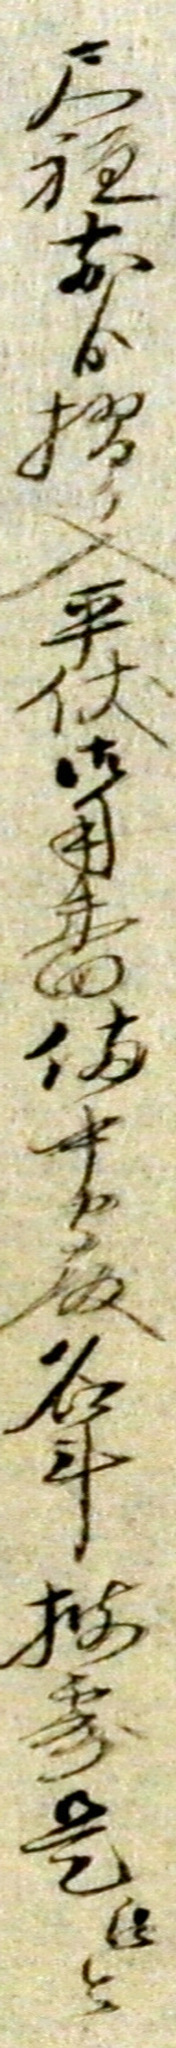尺程前ゟ摺り入平伏御用番備中守殿名斗披露是江と
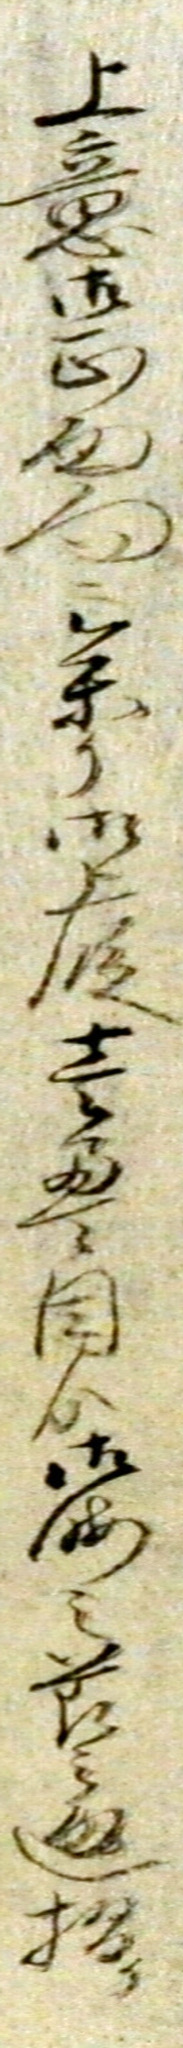上意御正面向二参り御上段壱畳目ゟ御暇之節之通摺り
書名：日光御名代相勤候節ノ留
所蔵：伊那市立高遠町図書館・合同会社AMANE
